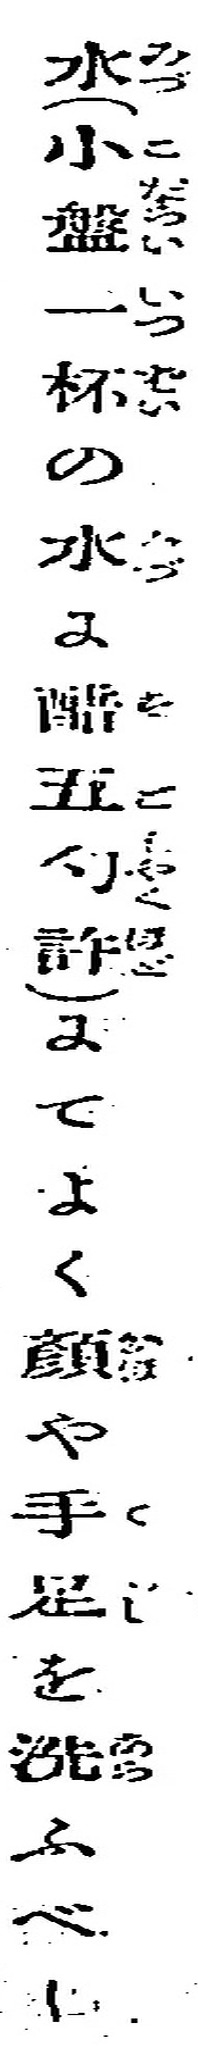水[小盥一杯の水に醋五勺許]にてよく顔や手足を洗ふべし
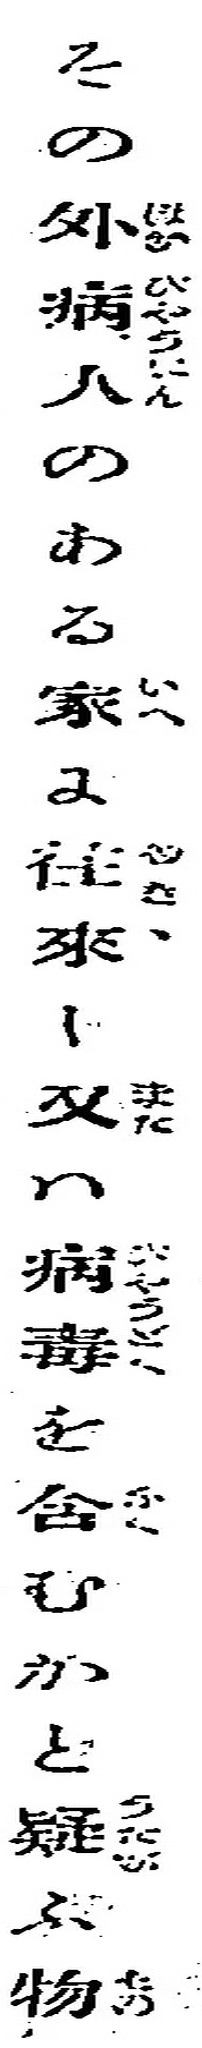その外病人のある家に往來し又は病毒を含むかと疑ふ物
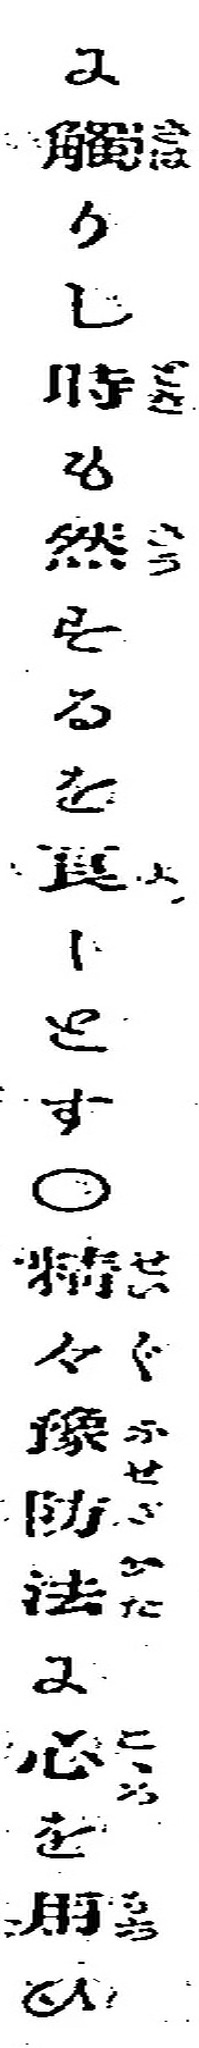に觸りし時も然するを良しとす〇精々豫防法に心を用ひ
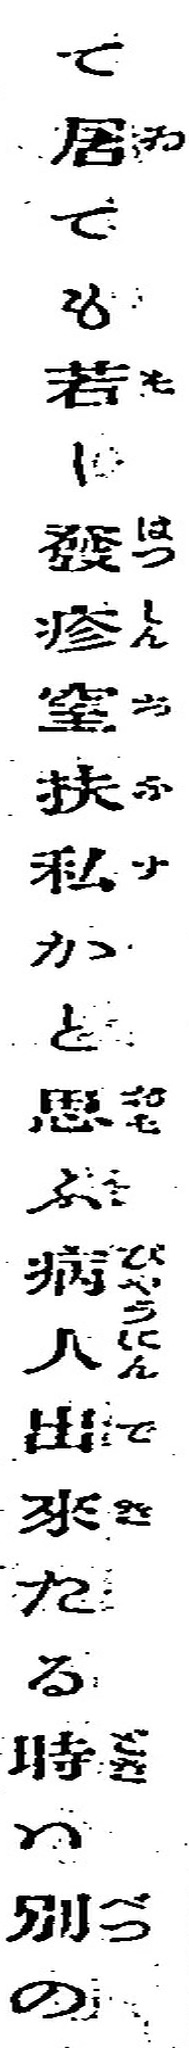て居ても若し発疹窒扶私かと思ふ病人出來たる時は別の
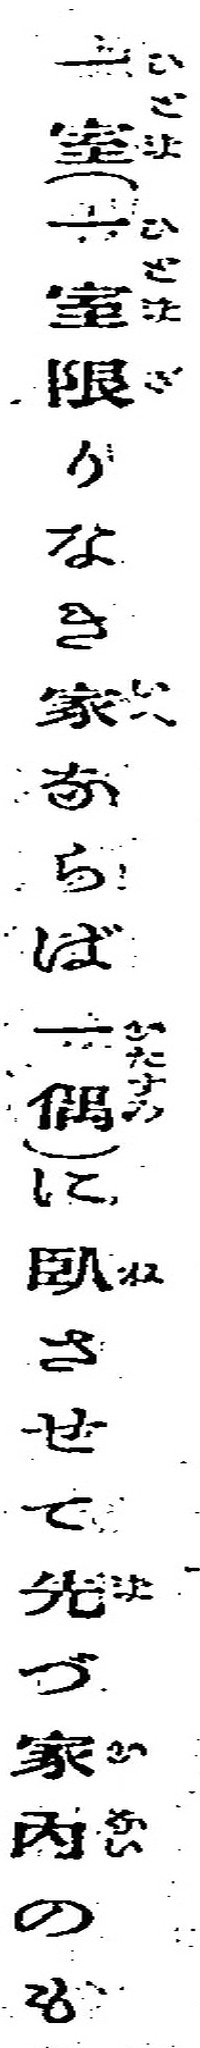一室[一室限りなき家ならば一隅]に臥させｓて先づ家内のも
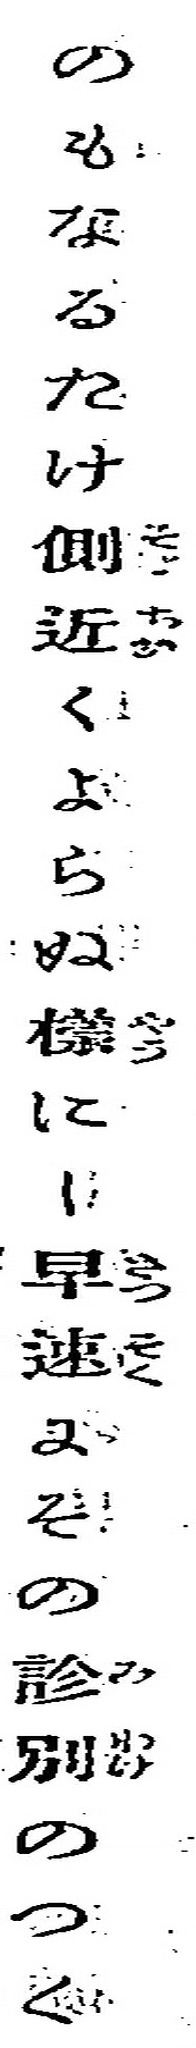のもなるたけ側近くよらぬ様にし早速にその診別のつく
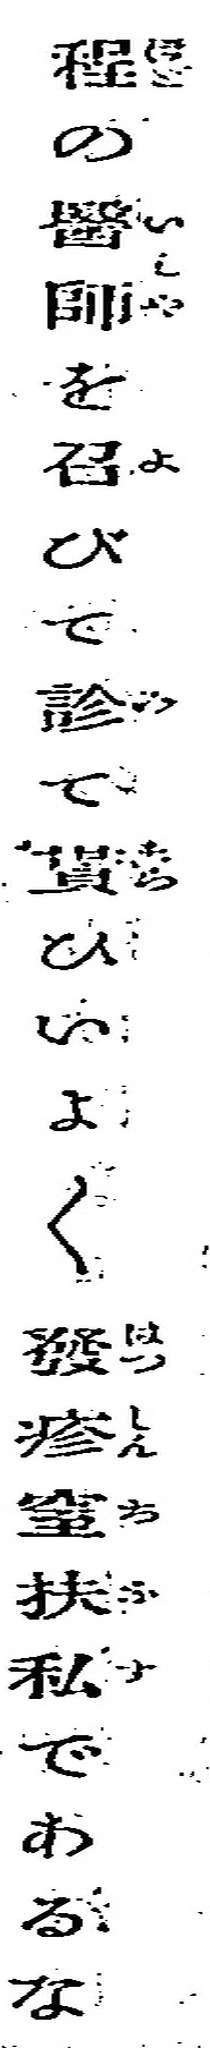程の醫師を召びて診て貰ひいよ〳〵発疹窒扶私であるな
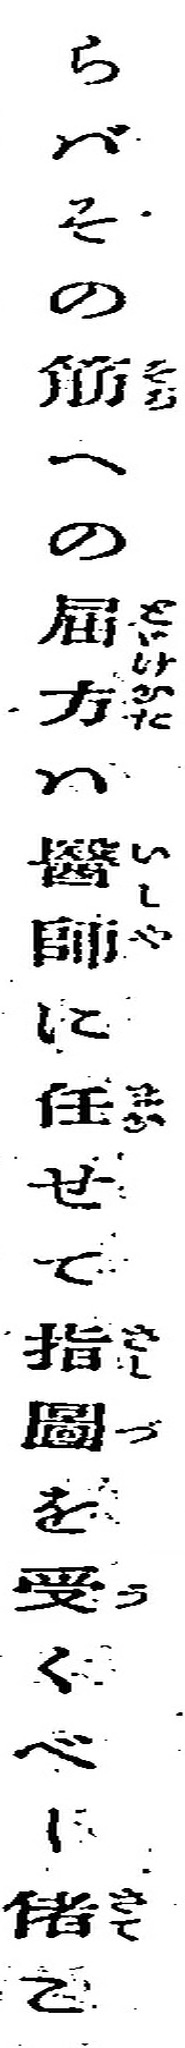らばその筋への届方は醫師に任せて指圖を受くべし偖こ
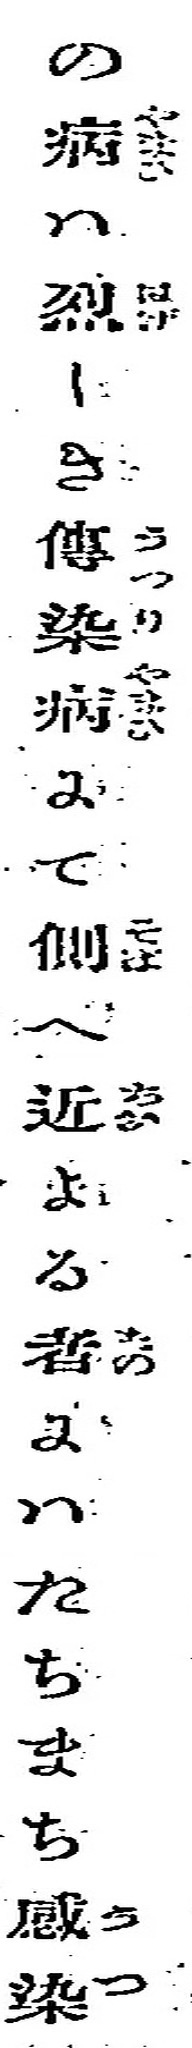の病は烈しき傅染病にて側へ近よる者にはたちまち感染
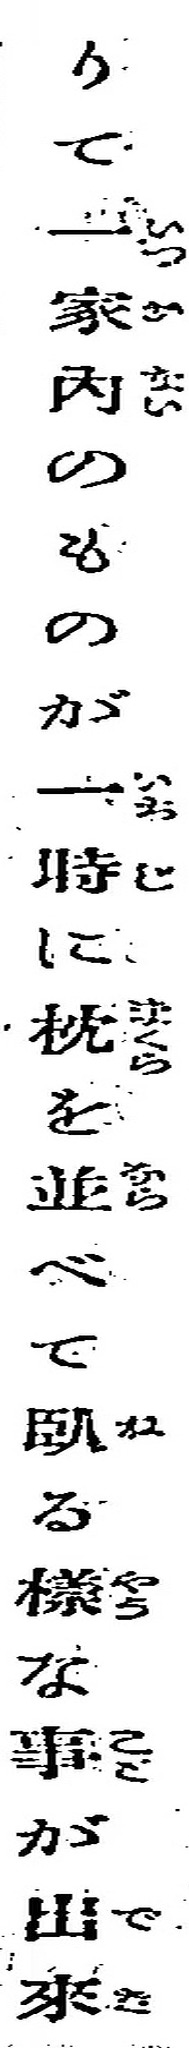りて一家内のものが一時に枕を並べて臥る様な事が出來
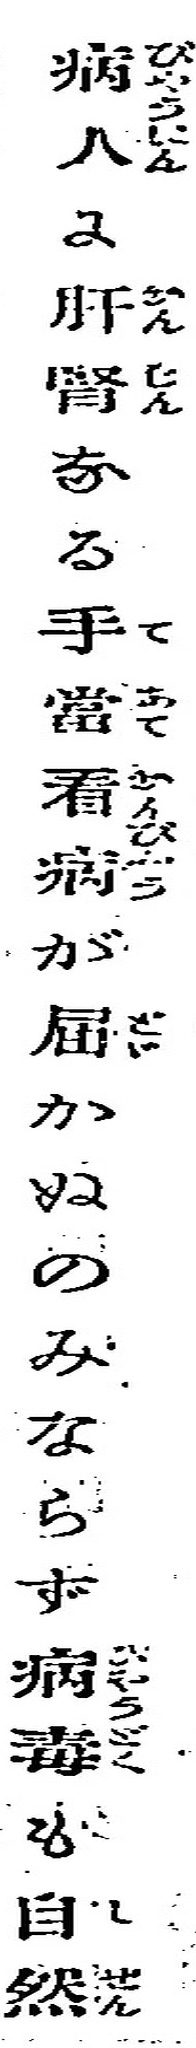病人に肝腎なる手當看病が届かぬのみならず病毒も自然
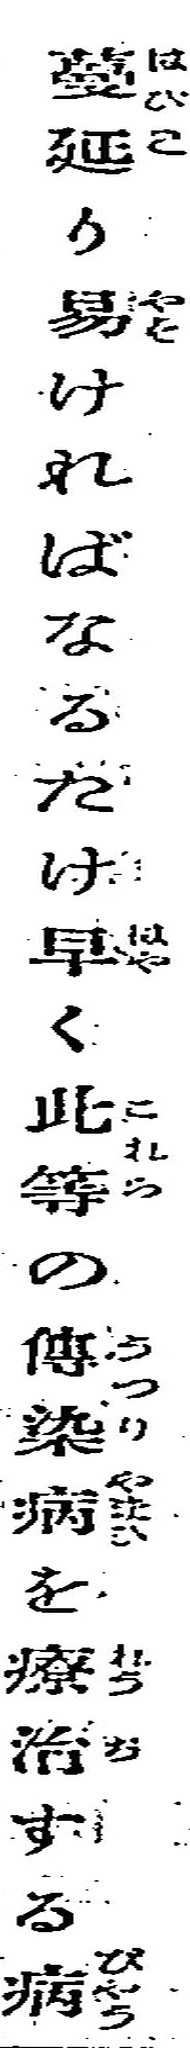蔓延り易ければなるたけ早く此等の傅染病を療治する病
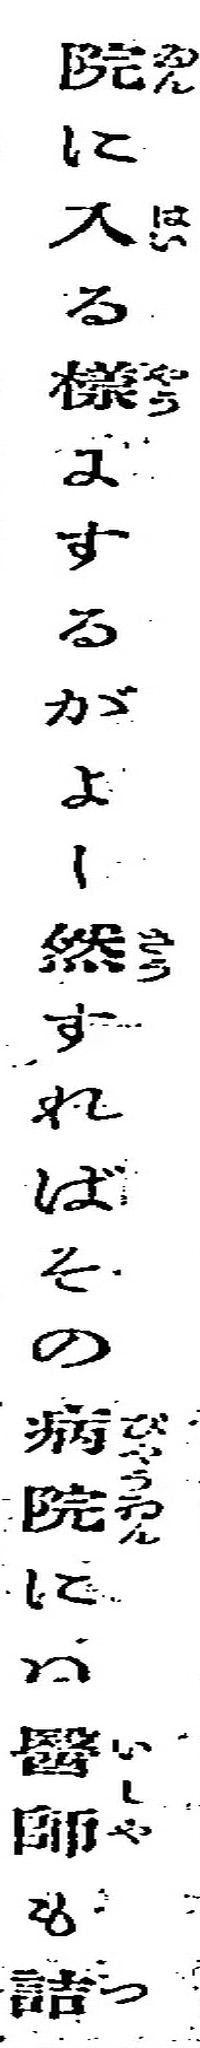院に入る様にするがよし然すればその病院には醫師も詰
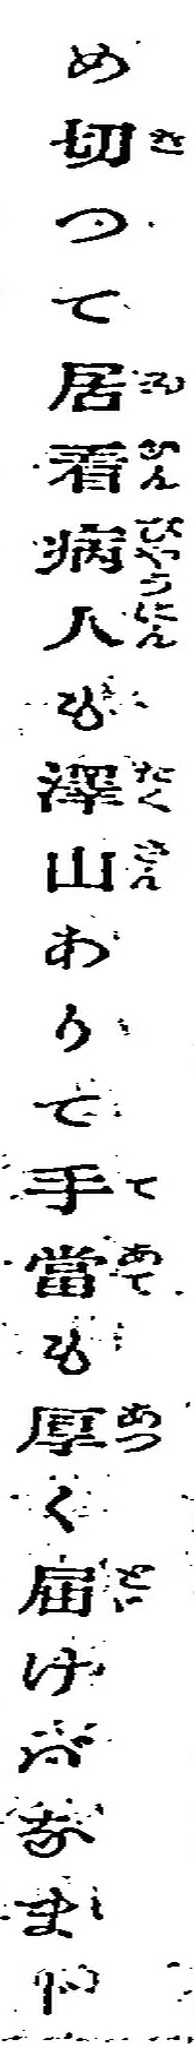め切つて居看病人も澤山ありて手當も厚く届けばなまじ
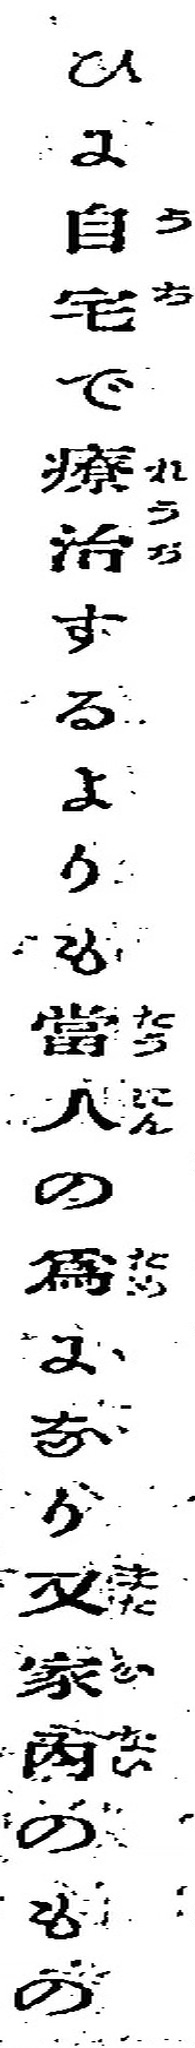ひに自宅で療治するよりも當人の為になり又家内のもの

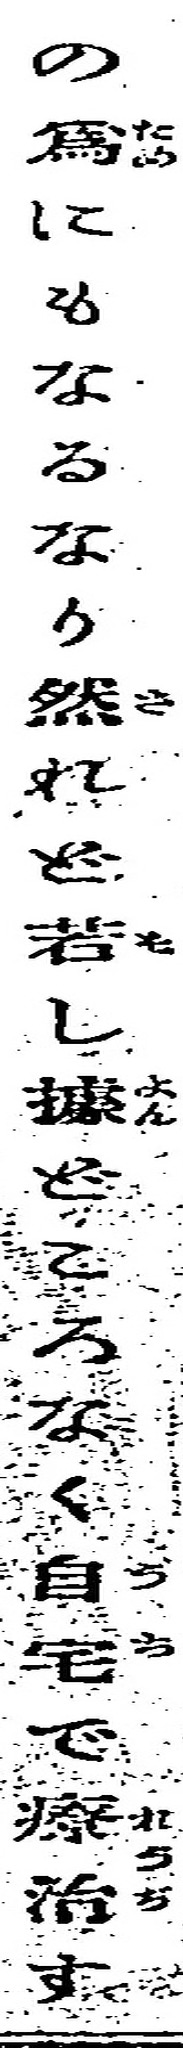の為にもなるなり然れど若し據どころなく自宅で療治す
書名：発疹窒扶私予防の訓
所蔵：国立国会図書館 National Diet Library, JAPAN
